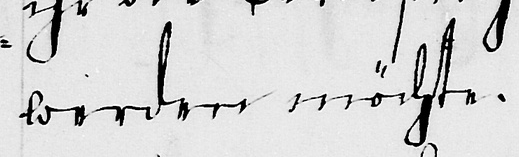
werden möchte.
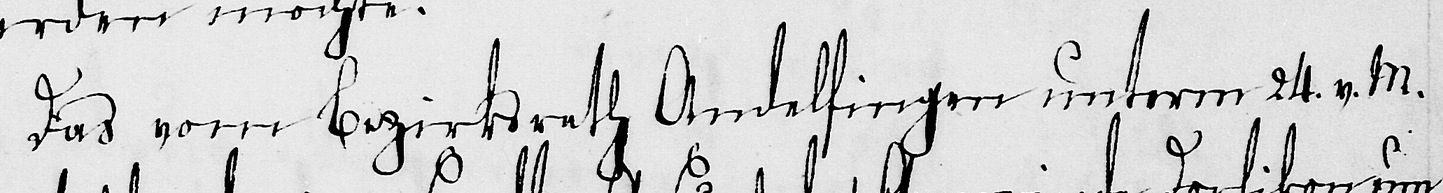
Das vom Bezirksrath Andelfingen unterm 24. v. M.
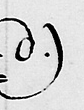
d.)
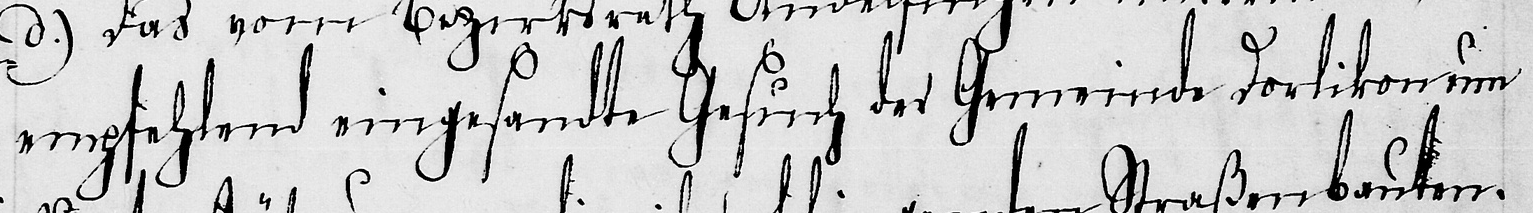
empfehlend eingesandte Gesuch der Gemeinde Dorlikon um
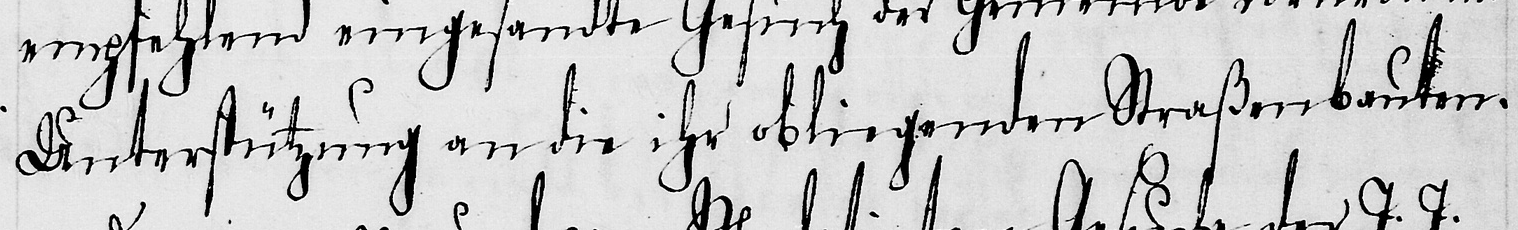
Unterstützung an die ihr obliegenden Straßenbauten.
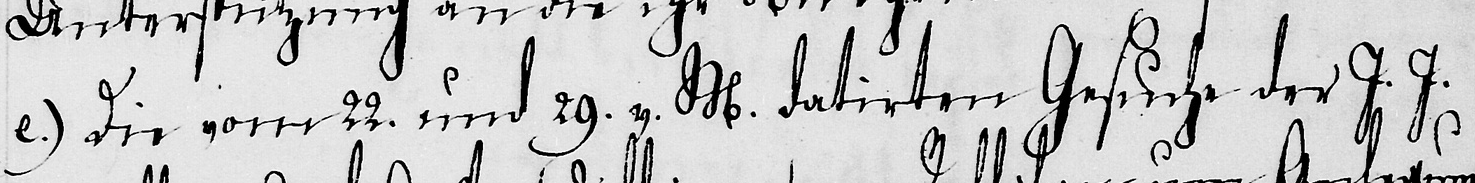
e.) Die vom 22. und 29. v. M. datirten Gesuche der J. J.
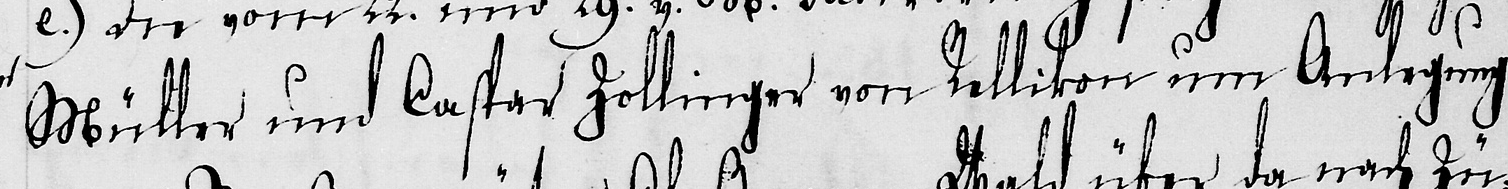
Müller und Caspar Zollinger von Rellikon um Anlegung
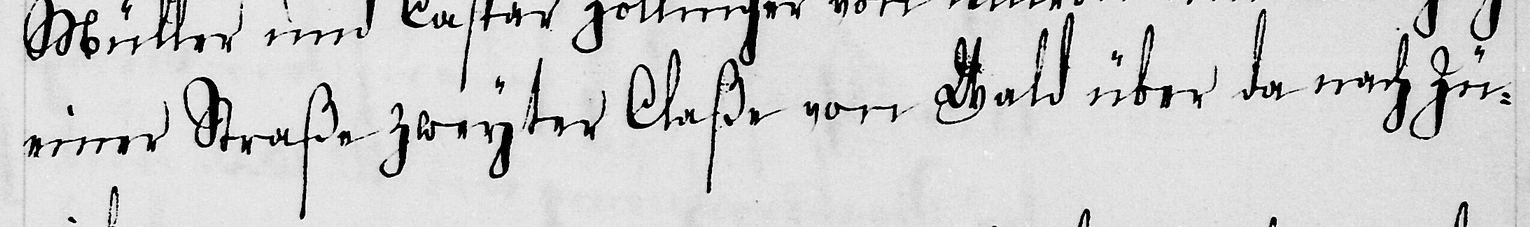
einer Straße zweyter Claße von Wald über da nach Zü¬
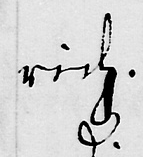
rich.
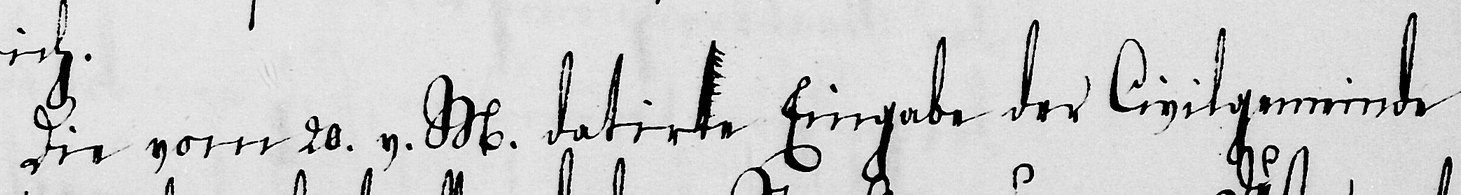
Die vom 20. v. M. datirte Eingabe der Civilgemeinde
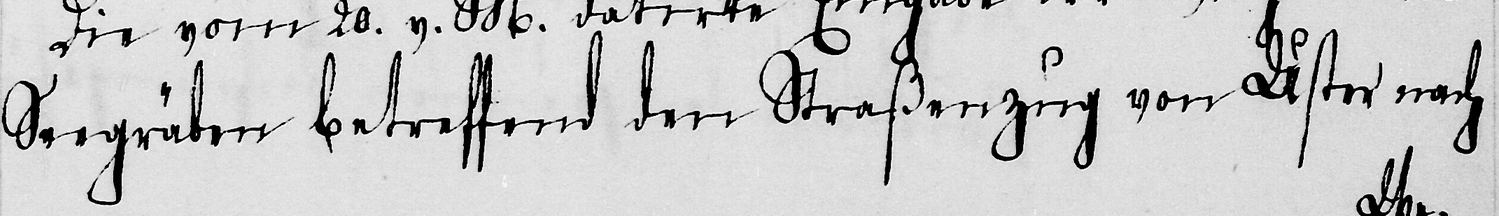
Seegräben betreffend den Straßenzug von Uster nach
